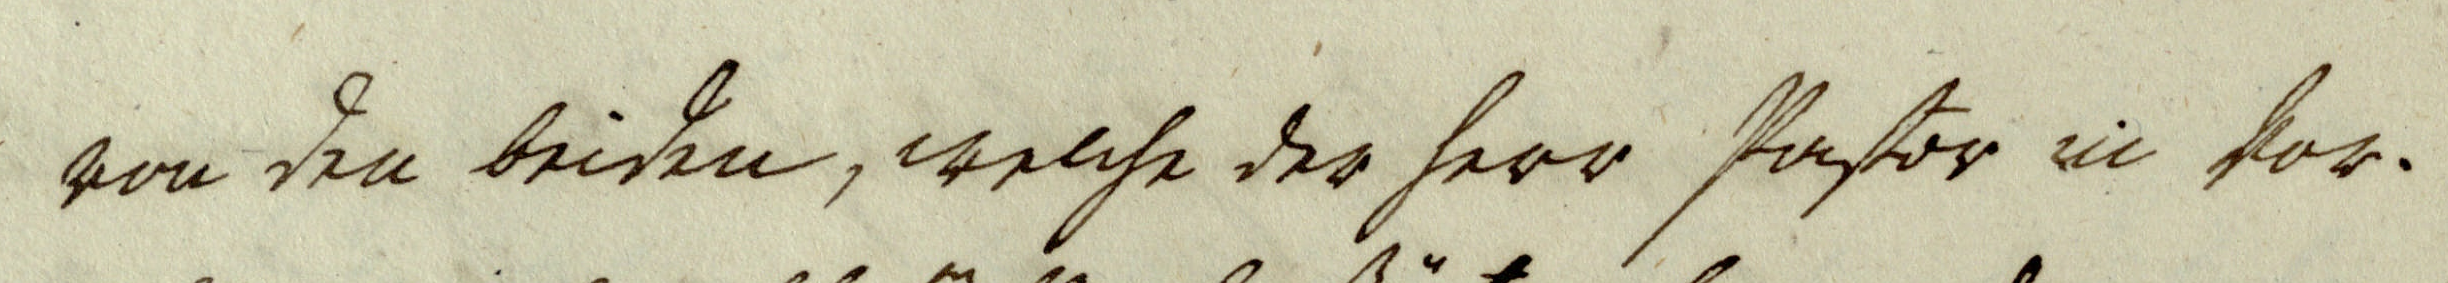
von den beiden, welche der Herr Pastor in Vor¬
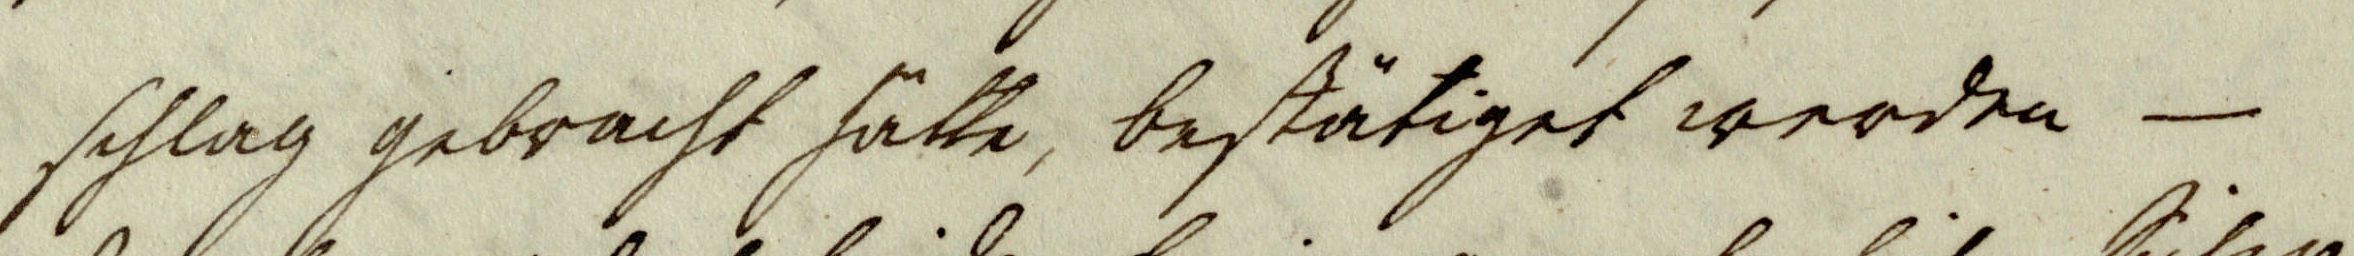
schlag gebracht hätte, bestätiget werden.
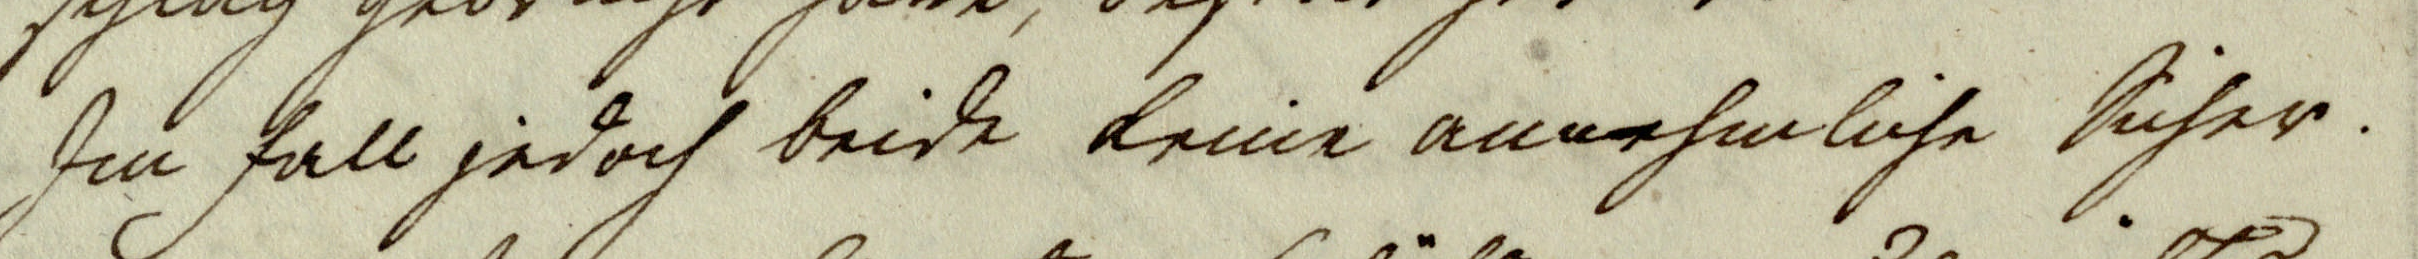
Im Fall jedoch beide keine annehmliche Sicher¬
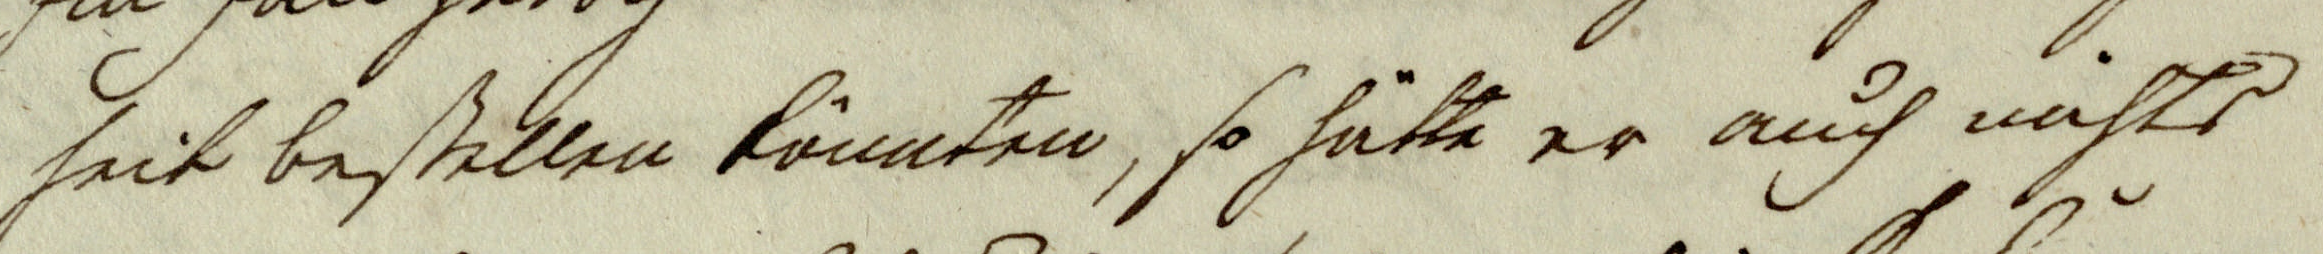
heit bestellen könnten, so hätte er auch nichts
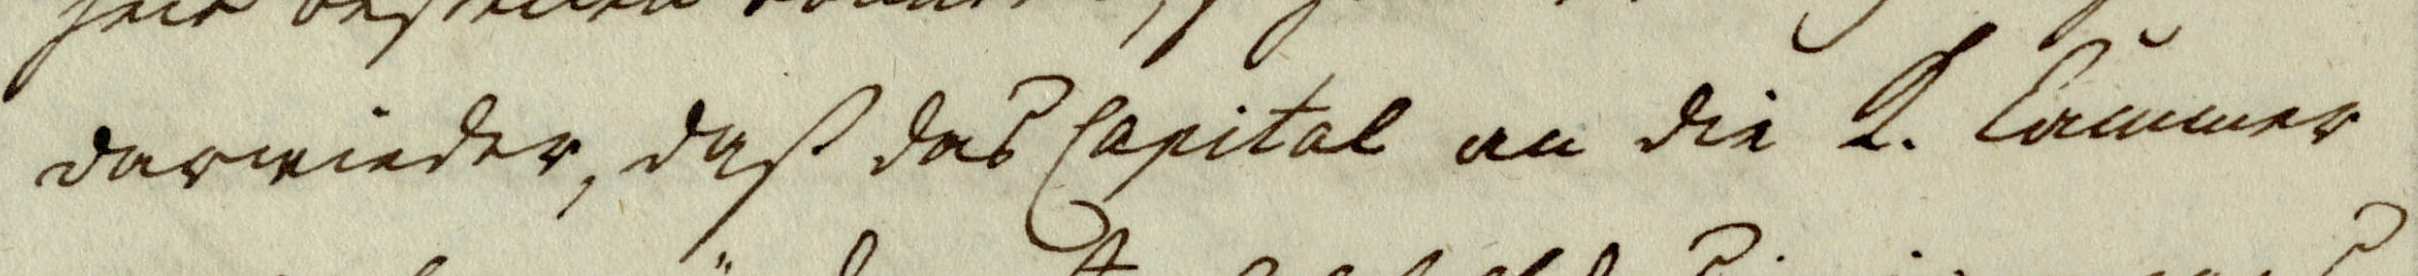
darwieder, daß das Capital an die K. Cammer
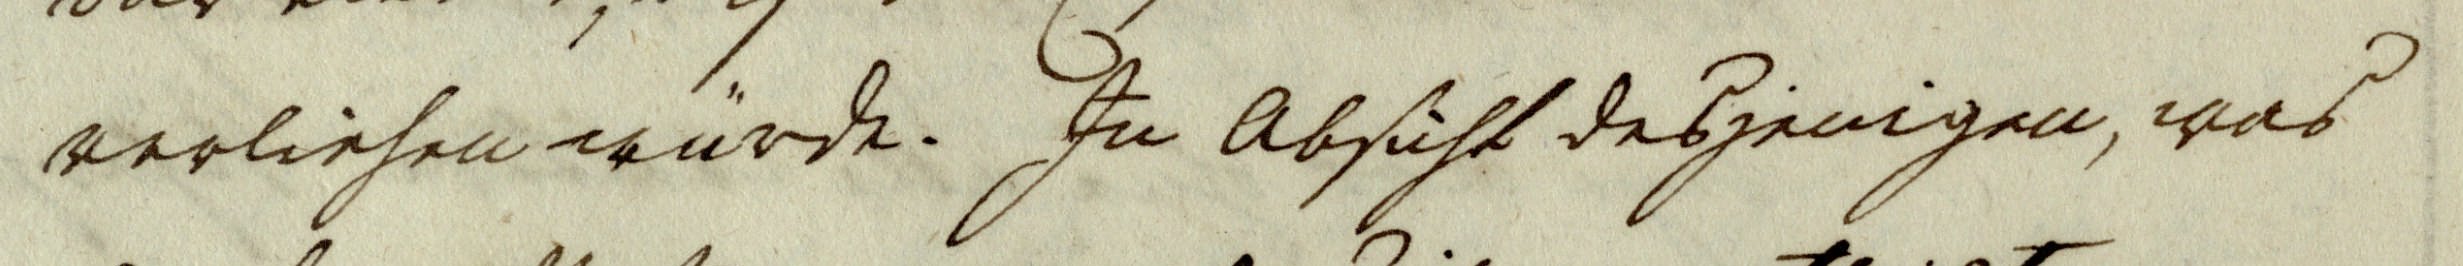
verliehen würde. In Absicht desjenigen, was
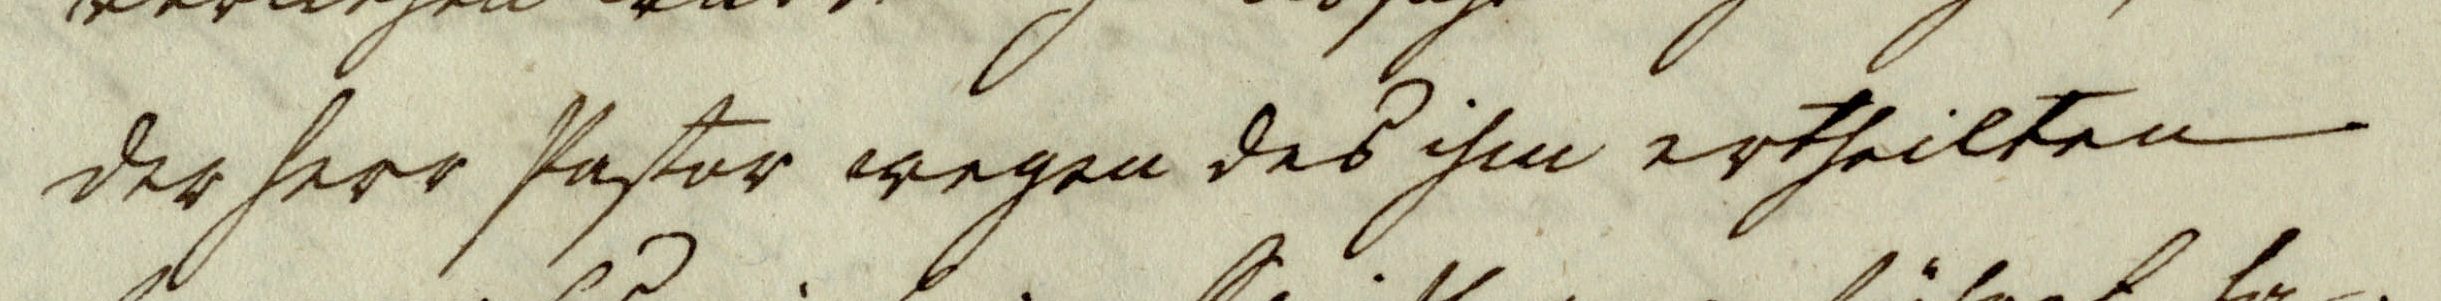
der Herr Pastor wegen des ihm ertheilten
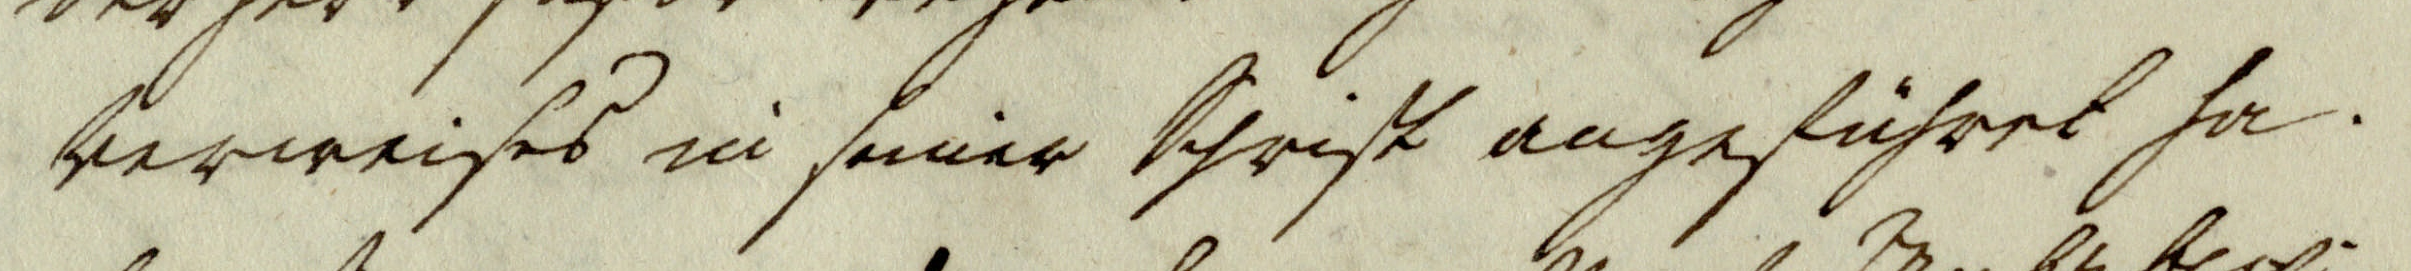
Verweises in seiner Schrift angeführet ha
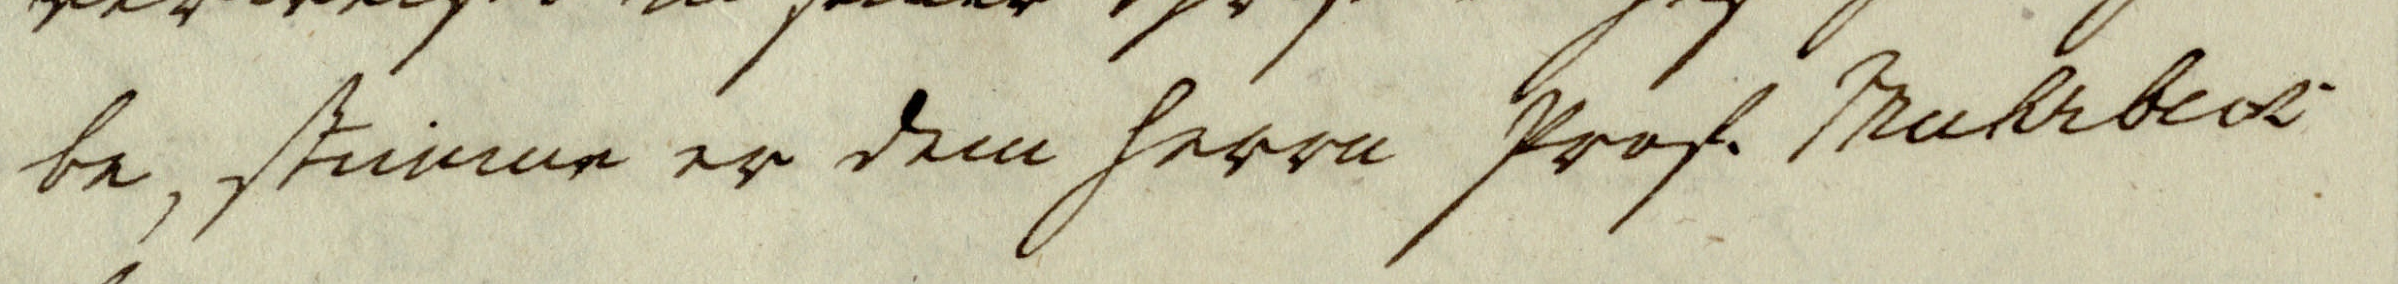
be, stimme er dem Herrn Prof. Muhrbeck
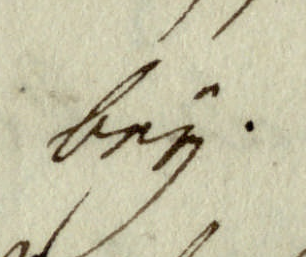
beÿ.
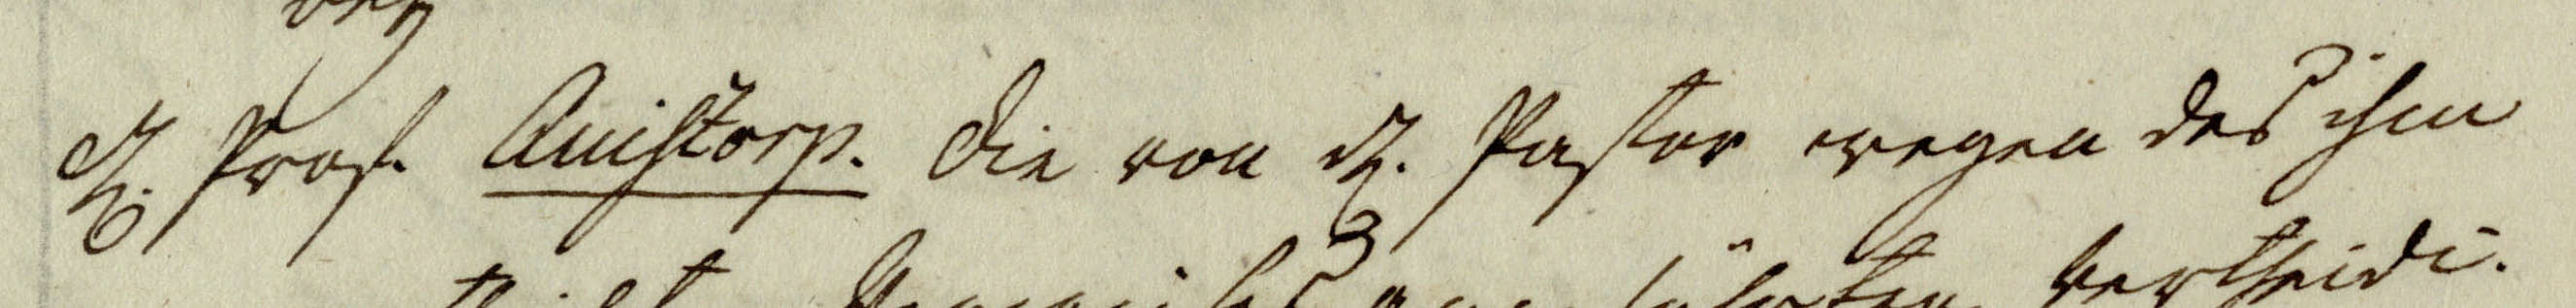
dh. Prof. Quistorp. die von dh. Pastor wegen des ihm
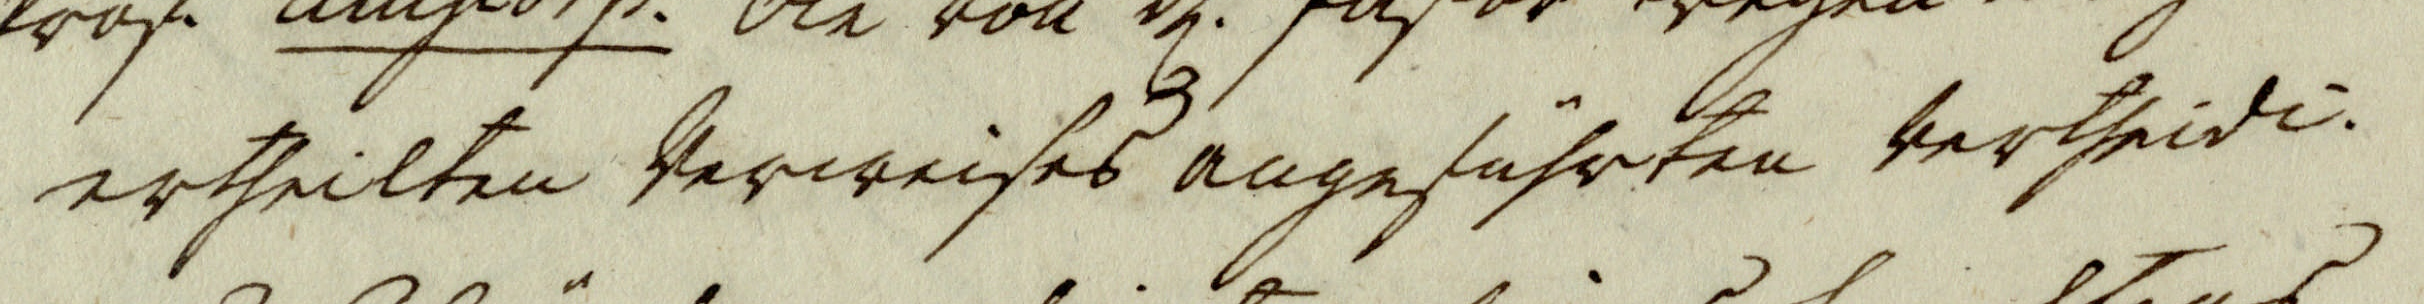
ertheilten Verweises angeführten Vertheidi¬
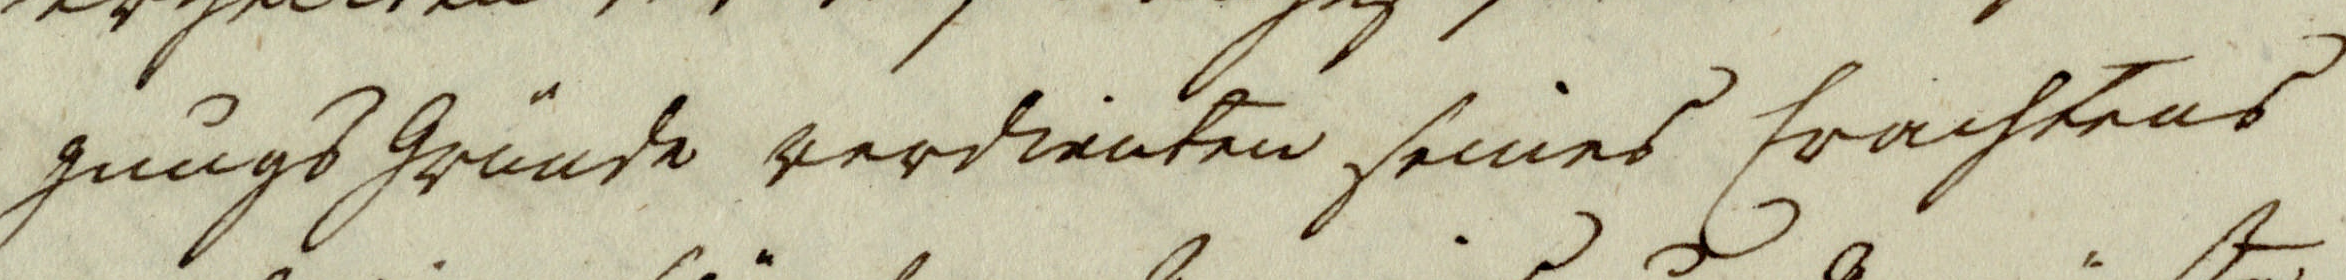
gungs Gründe verdienten seines Erachtens
